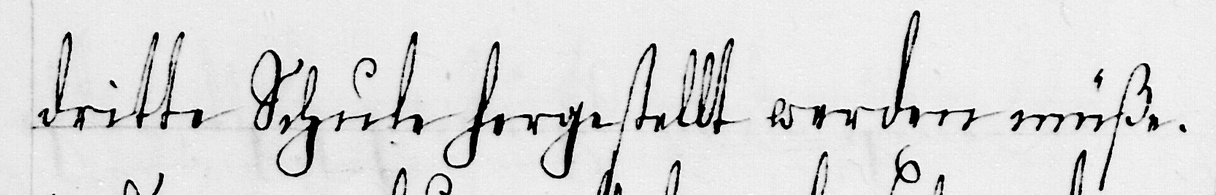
dritte Schule hergestellt werden müße.
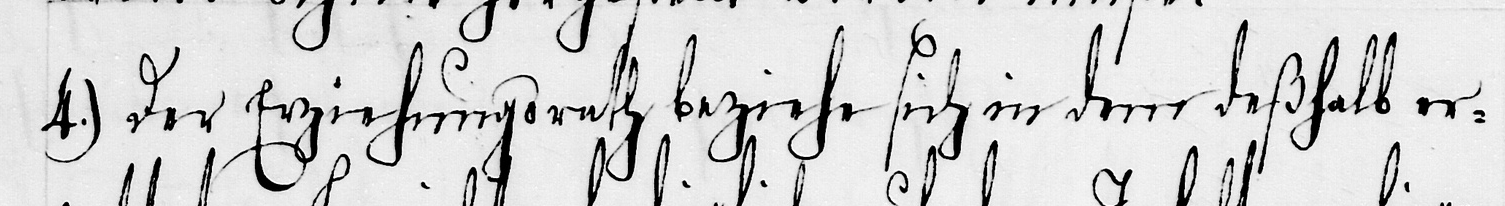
4.) Der Erziehungsrath beziehe sich in dem deßhalb er¬
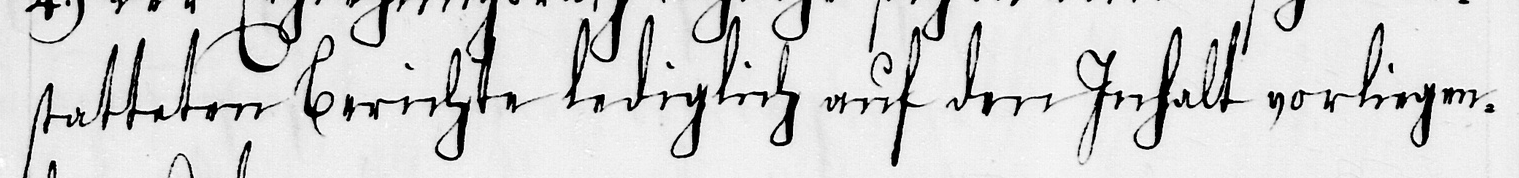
statteten Berichte lediglich auf den Inhalt vorliegen¬
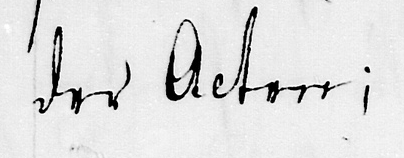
der Acten;
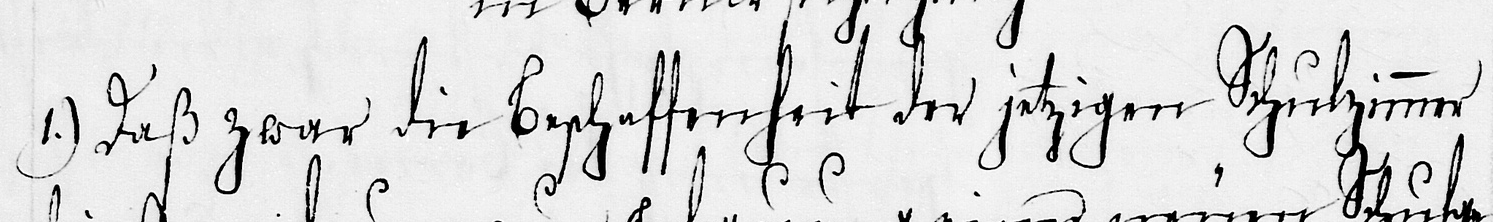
1.) Daß zwar die Beschaffenheit der jetzigen Schulzimmer
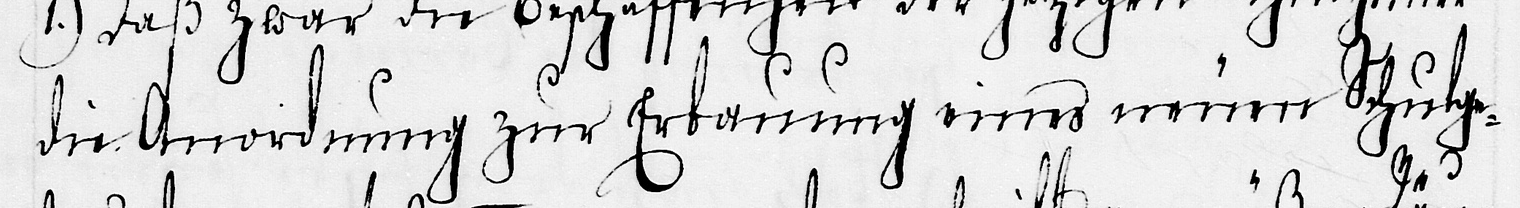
die Anordnung zur Erbauung eines neuen Schulge¬
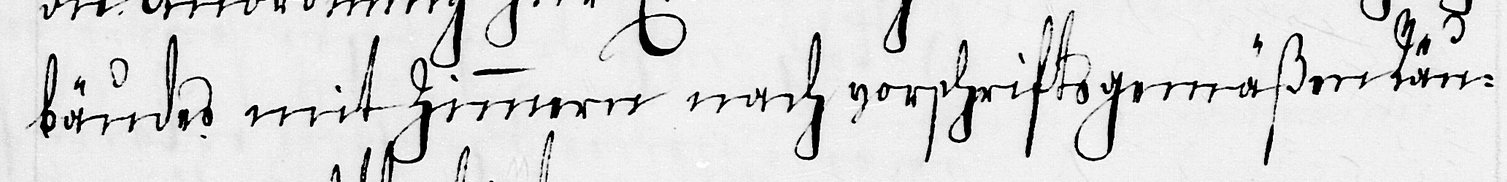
bäudes mit Zimmern nach vorschriftsgemäßen Räu¬
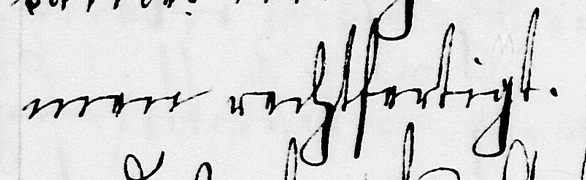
men rechtfertigt.
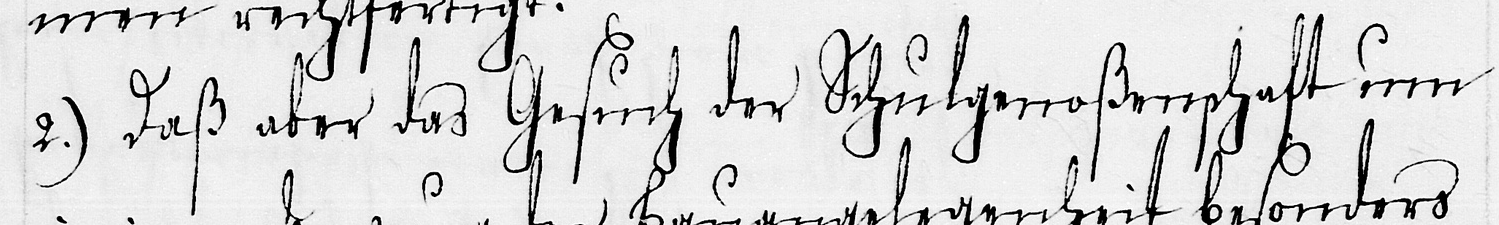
2.) Daß aber das Gesuch der Schulgenoßenschaft um
